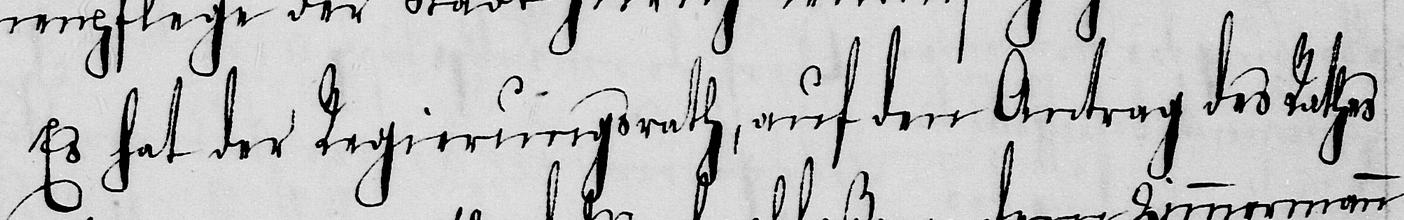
Es hat der Regierungsrath, auf den Antrag des Rath¬
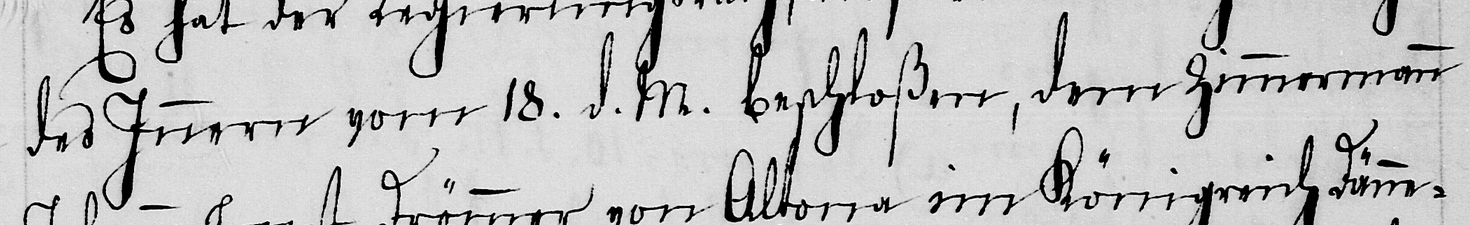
des Innern vom 18. d. M. beschloßen, dem Zimmermann
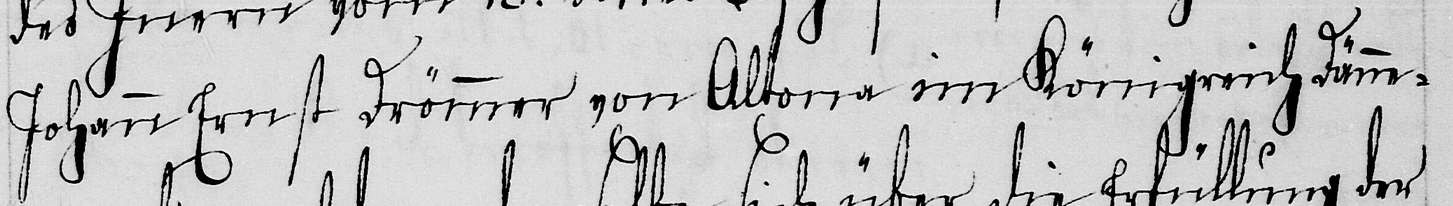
Johann Ernst Drömmer von Altona im Königreich Dänne¬
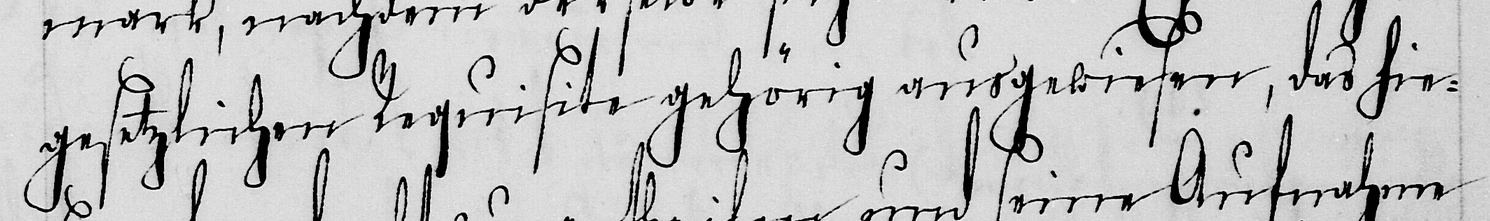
gesetzlichen Requisite gehörig ausgewiesen, das hie¬
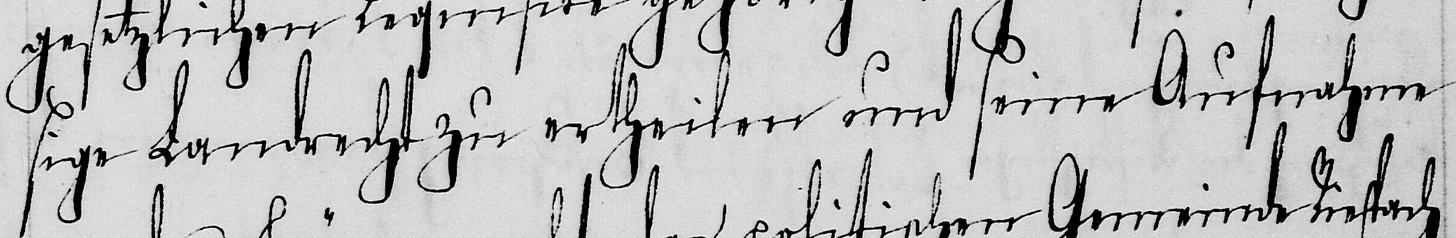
sige Landrecht zu ertheilen und seine Aufnahme
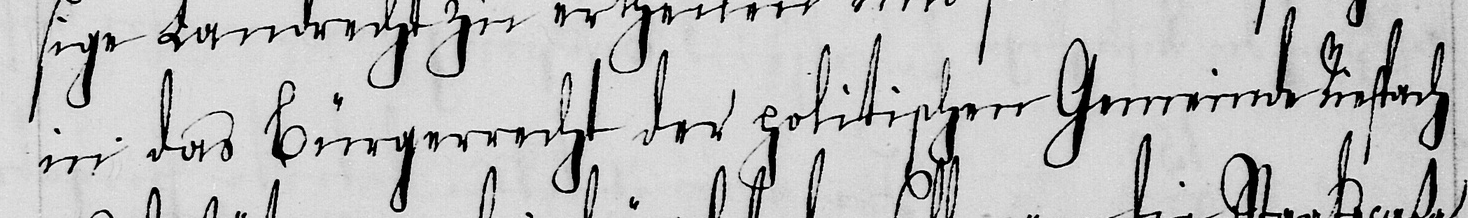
in das Bürgerrecht der politischen Gemeinde Riespach
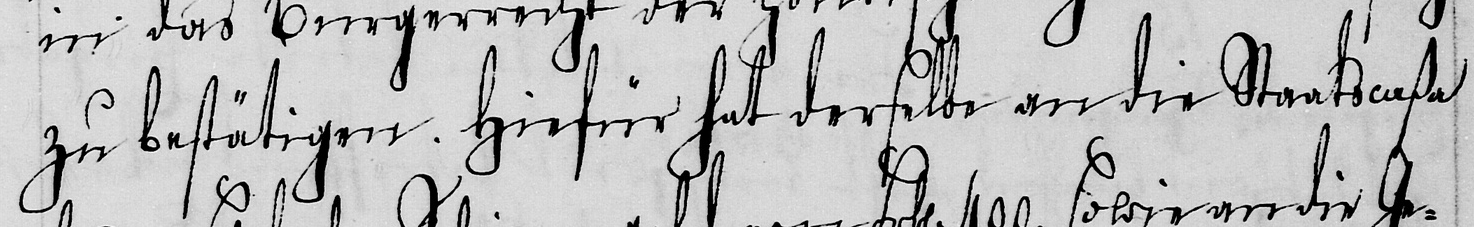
zu bestätigen. Hiefür hat derselbe an die Staatscaßa
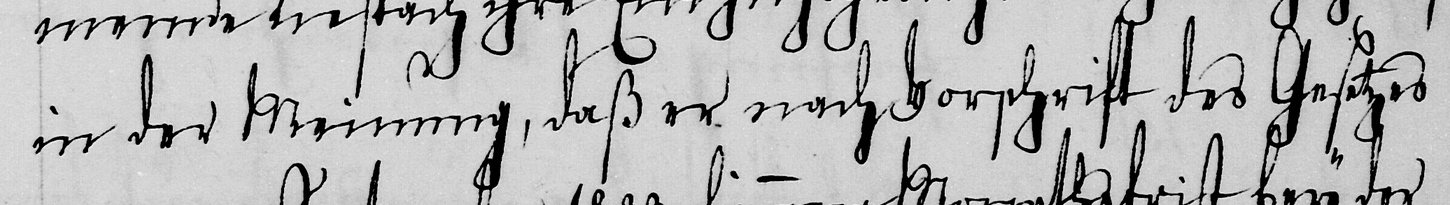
in der Meinung, daß er nach Vorschrift des Gesetzes
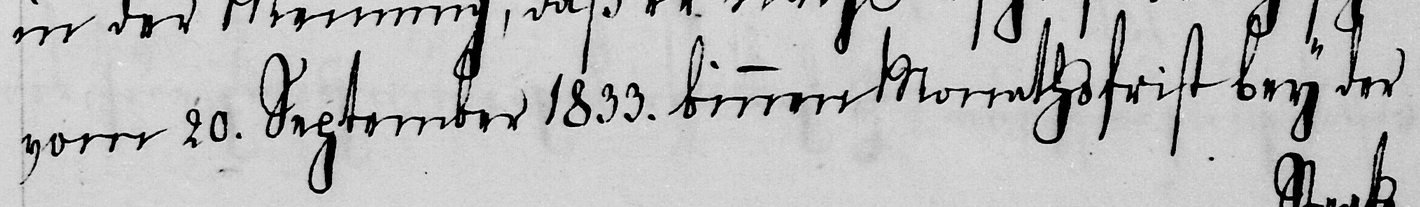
vom 20. September 1833. binnen Monathsfrist bey der
